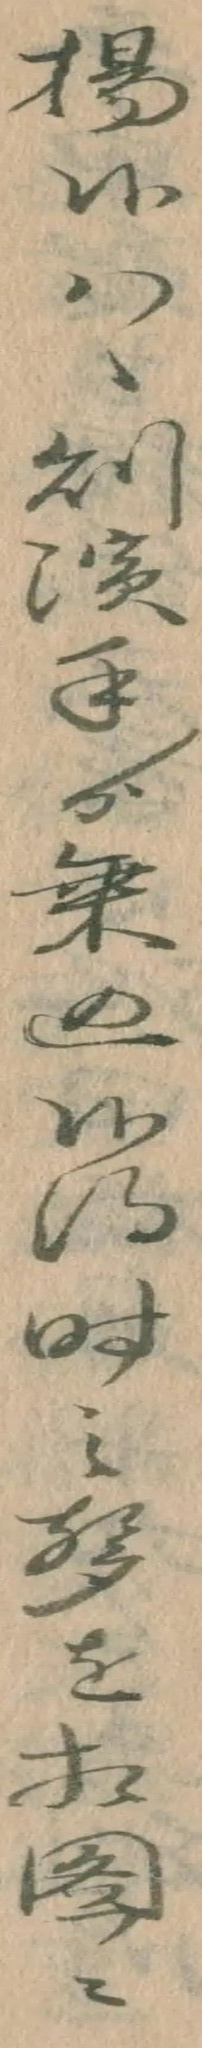揚候はゝ則浜手ゟ乗込候得時之声を相図に
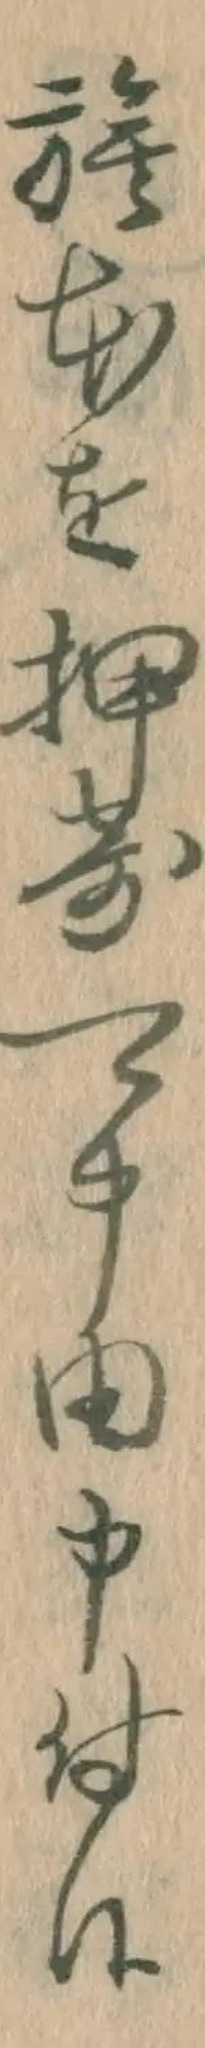旗本を押寄可申由申付候
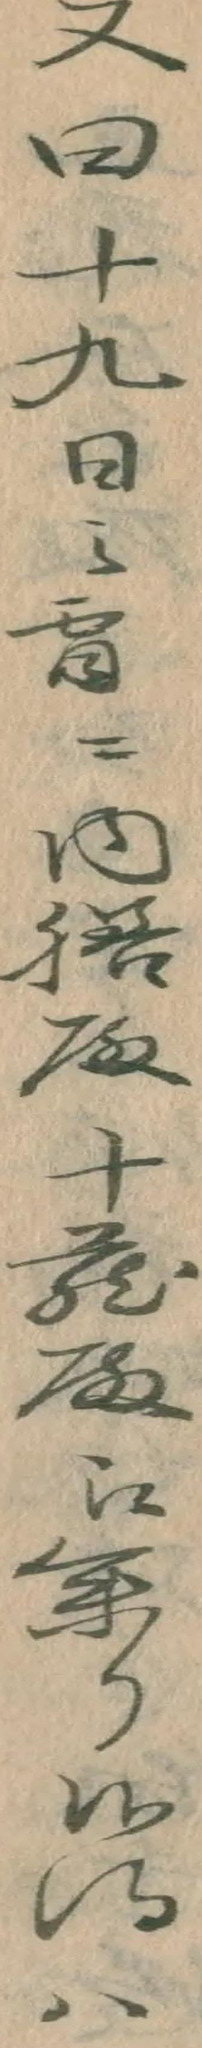又曰十九日之宵に内膳殿十蔵殿江参り候得は
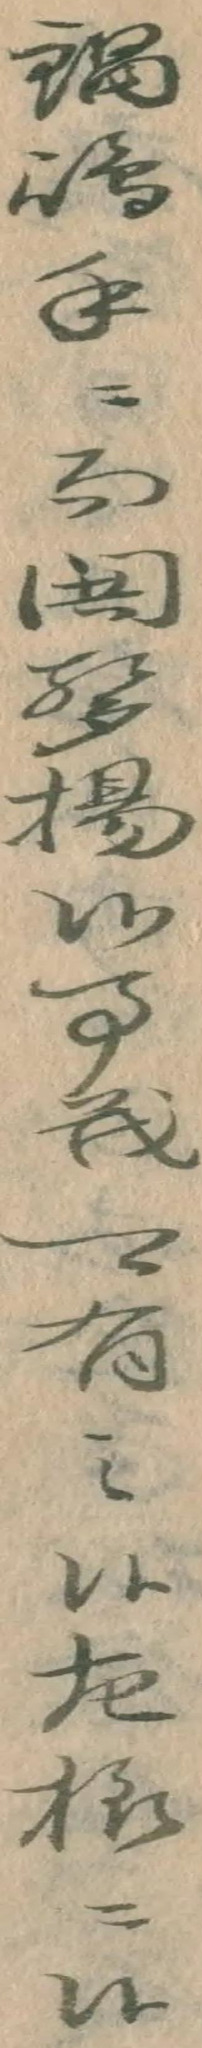鍋島手に而鬨声揚候事も可有之候左様に候
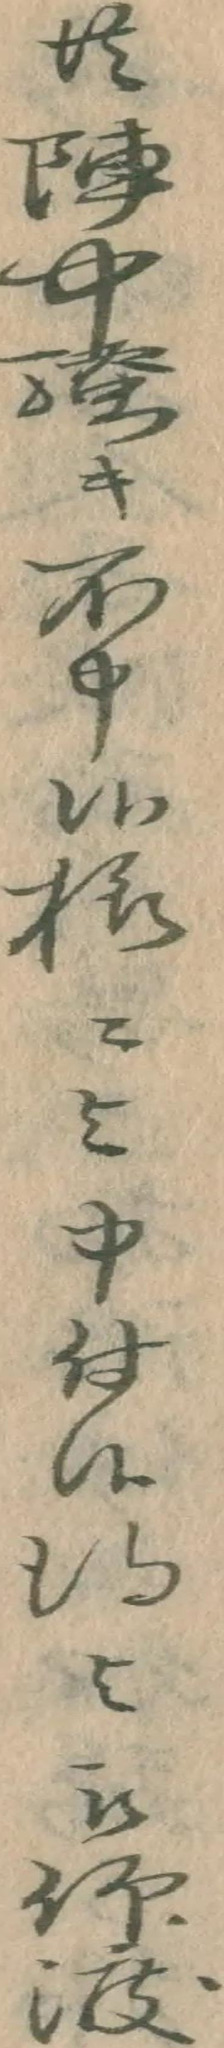共陣中騒き不申候様に与申付候得与被仰渡
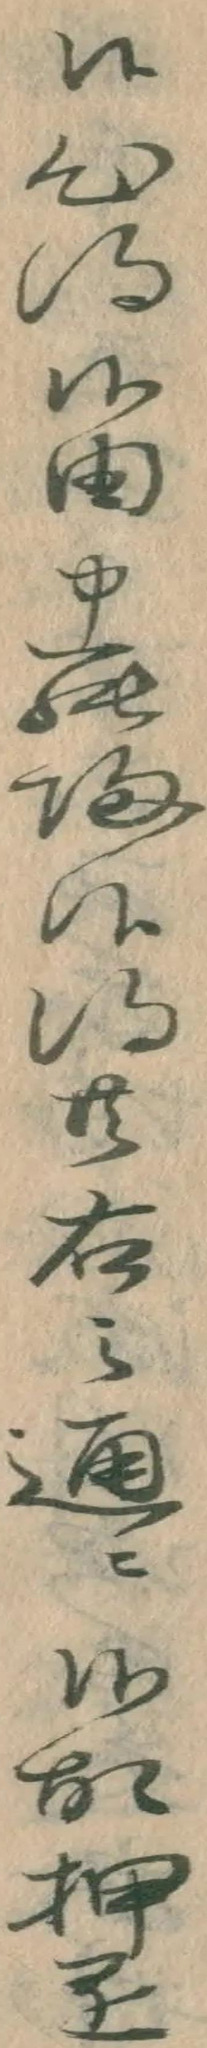候心得候由申罷帰候得共右之通に候故押懸
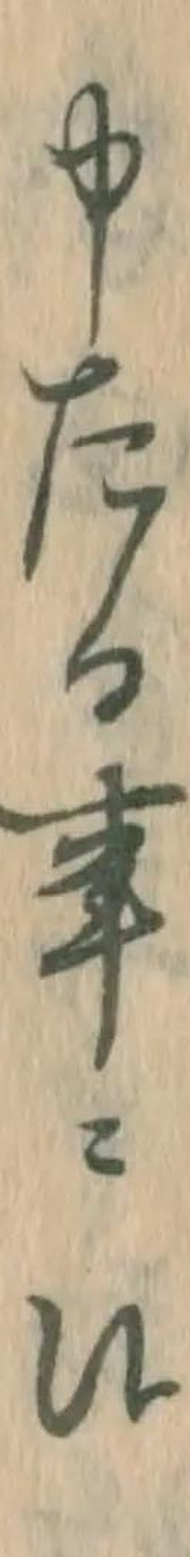申たる事に候
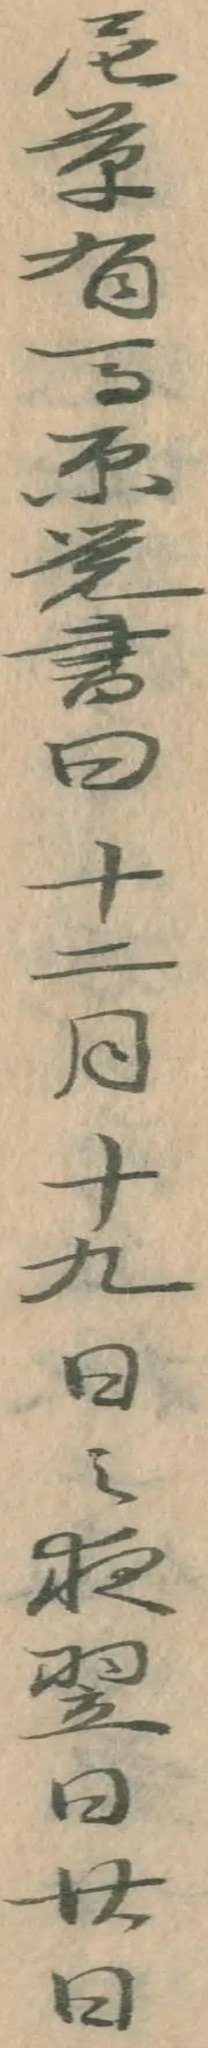尼草有馬原覚書曰十二月十九日之夜翌日廿日

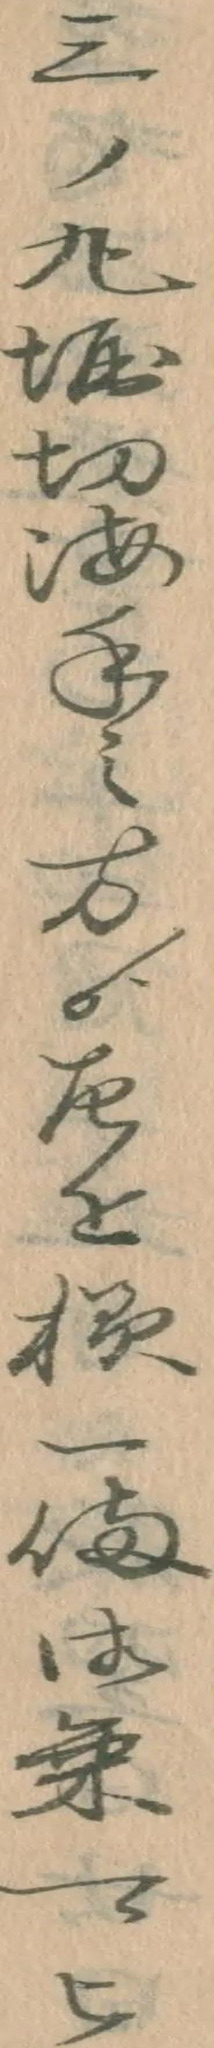三之丸堀切海手之方ゟ左近様一備御乗可被
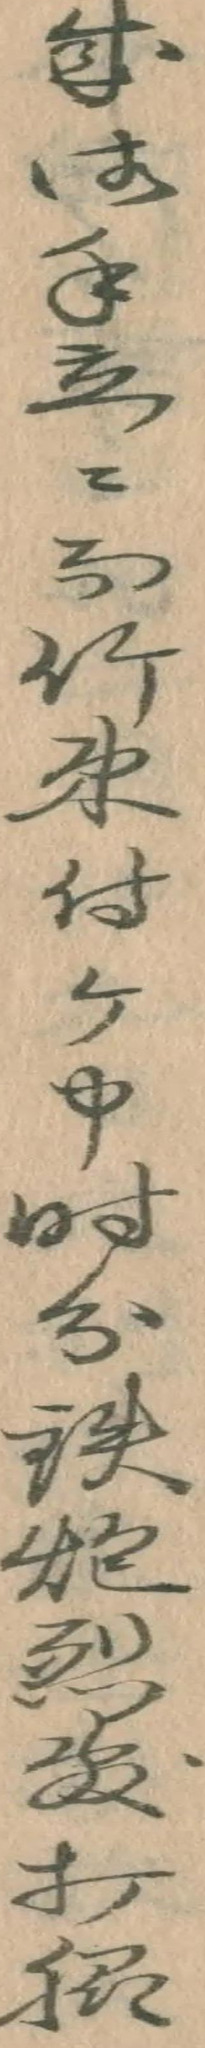成御手立に而竹束付け申時分鉄炮烈敷打脇
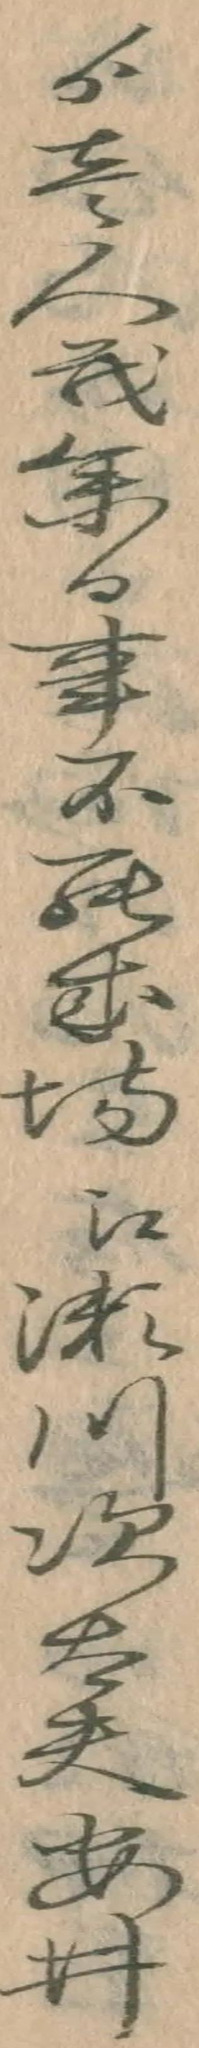ゟ壱人茂参る事不罷成場江瀬川次太夫安井
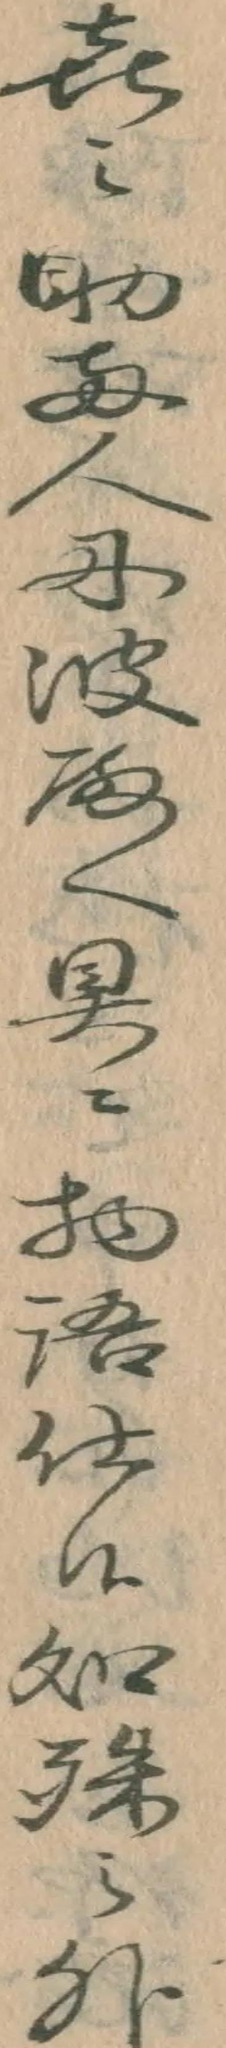喜之助両人丹波殿へ具に物語仕候処殊之外
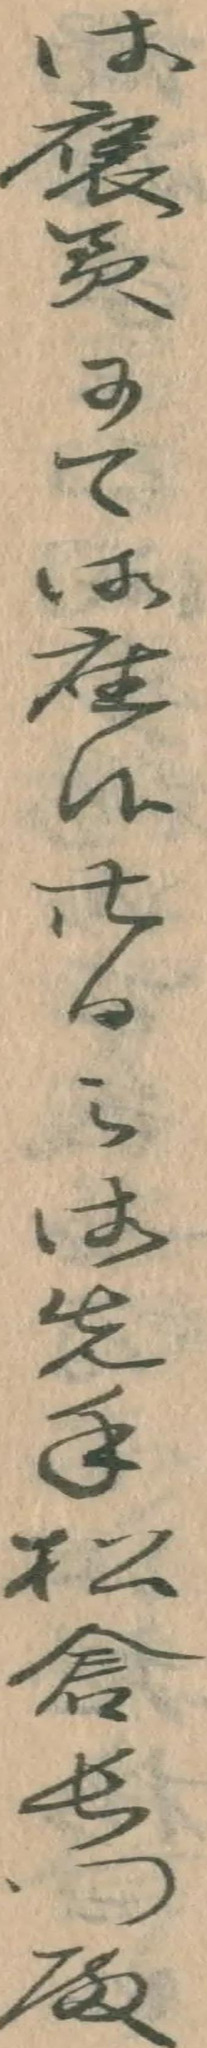御褒美尓て御座候廿日之御先手松倉長門殿
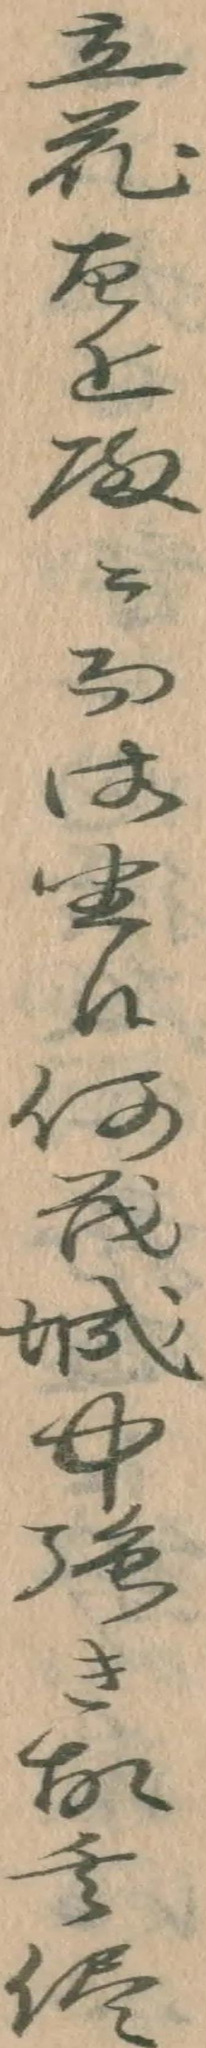立花左近殿に而御坐候何茂城中強き故其侭
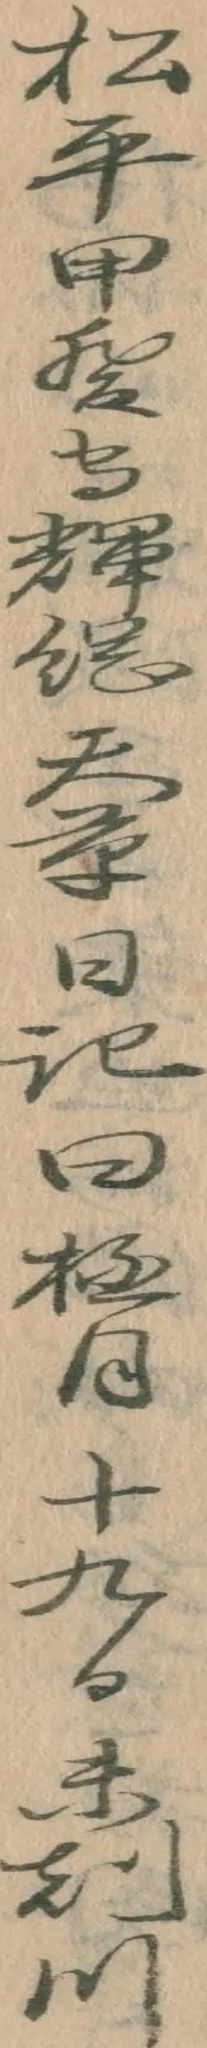松平甲斐守輝綱天草日記曰極月十九日未刻川
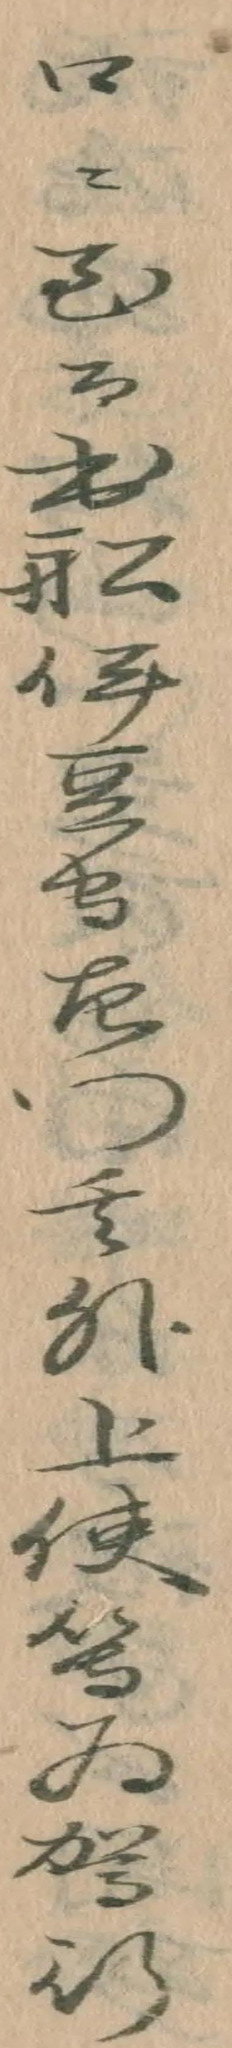口に至る出舩伊豆守左門其外上使等ゐ駕行
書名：切支丹御退治記 49巻. [4]
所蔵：国立国会図書館 National Diet Library, JAPAN
